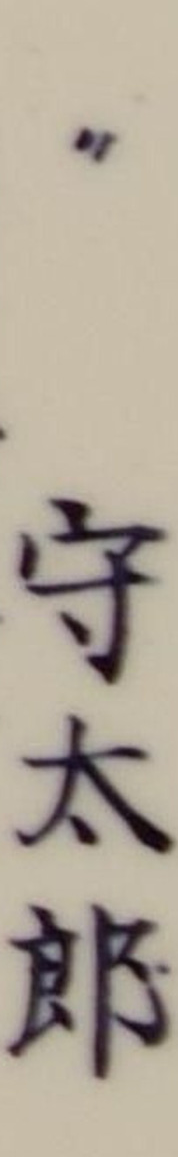宇太郎
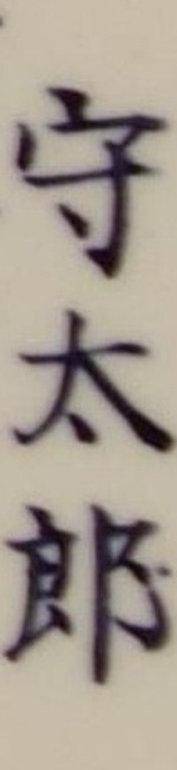宇太郎
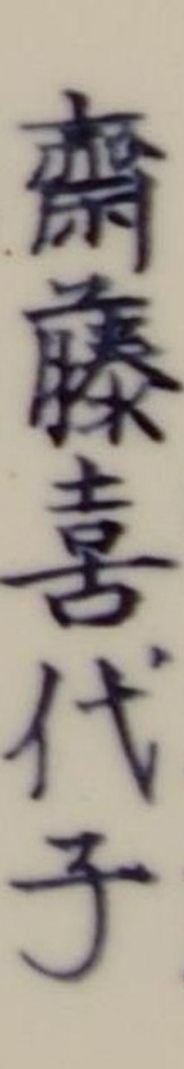斎藤喜代子
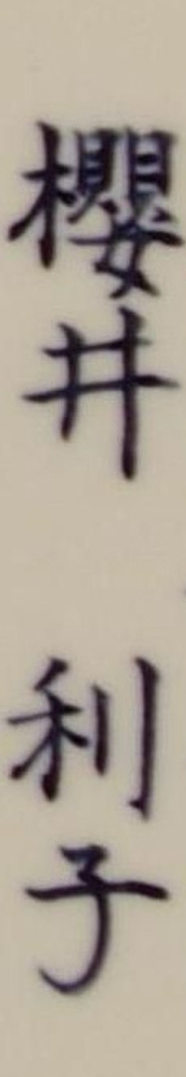桜井利子
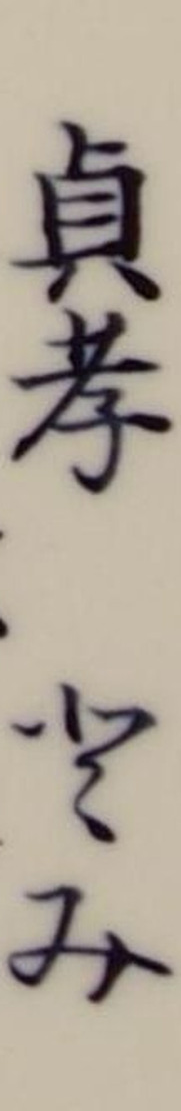貞孝とみ
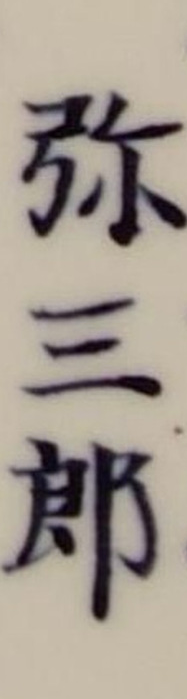弥三郎
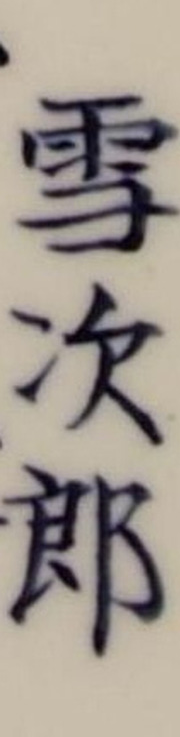雪次郎
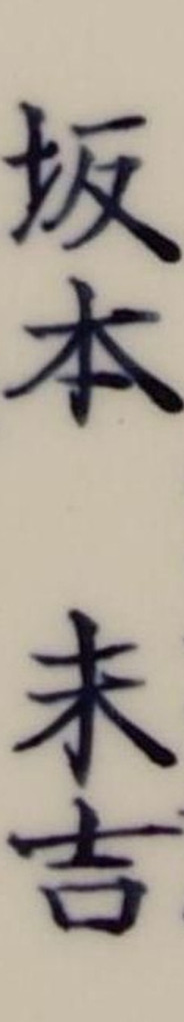坂本末吉
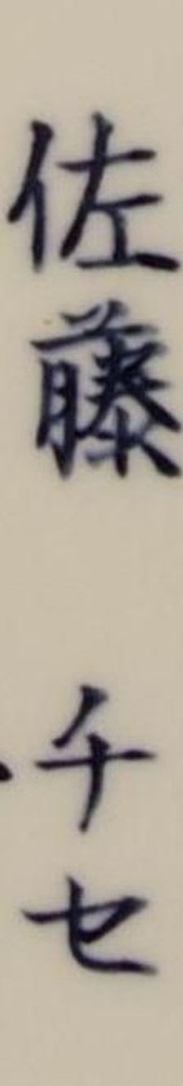佐藤チセ
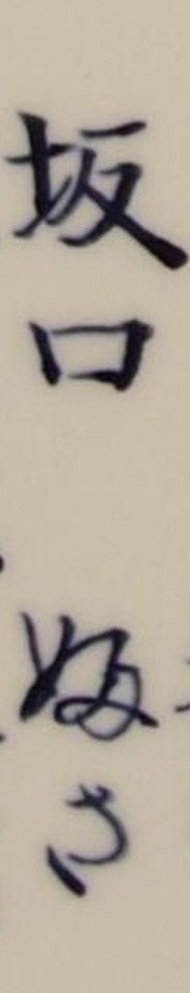坂口ふさ
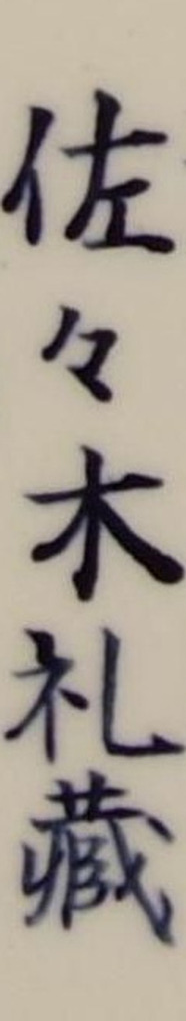佐々木礼蔵
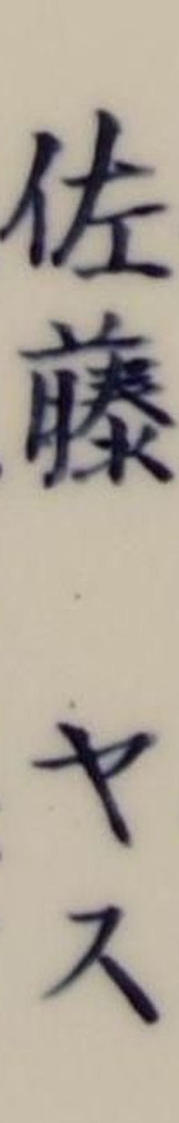佐藤ヤス
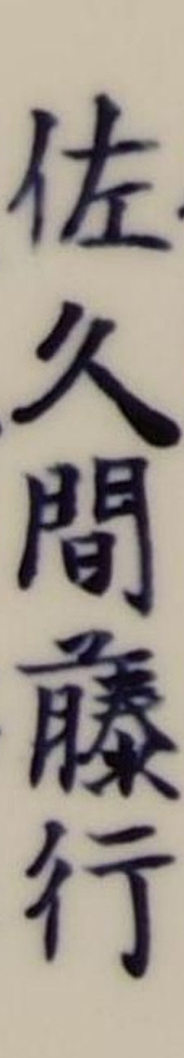佐久間藤行
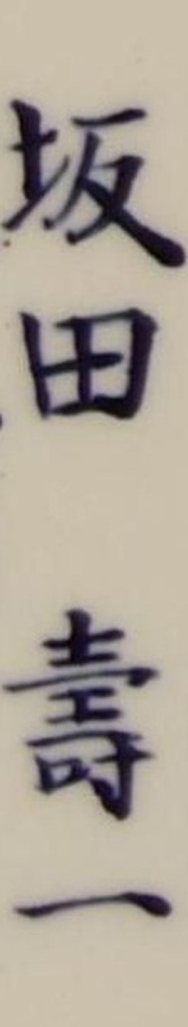坂田壽一
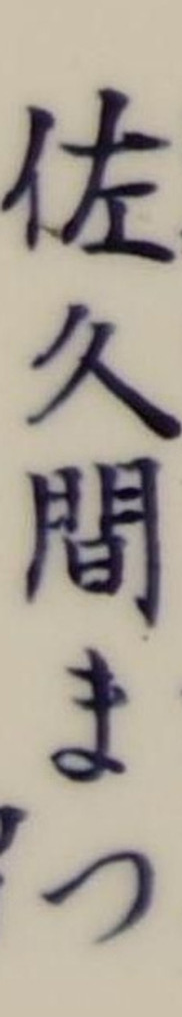佐久間まつ

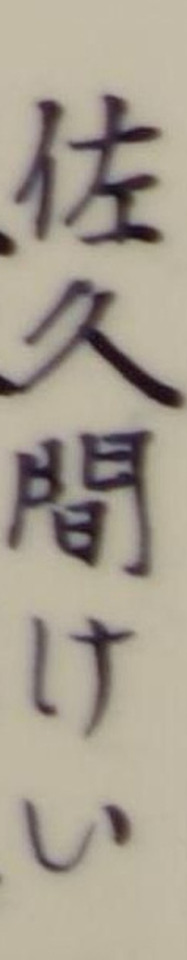佐久間けい
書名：E~L
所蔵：高野山金剛峯寺
